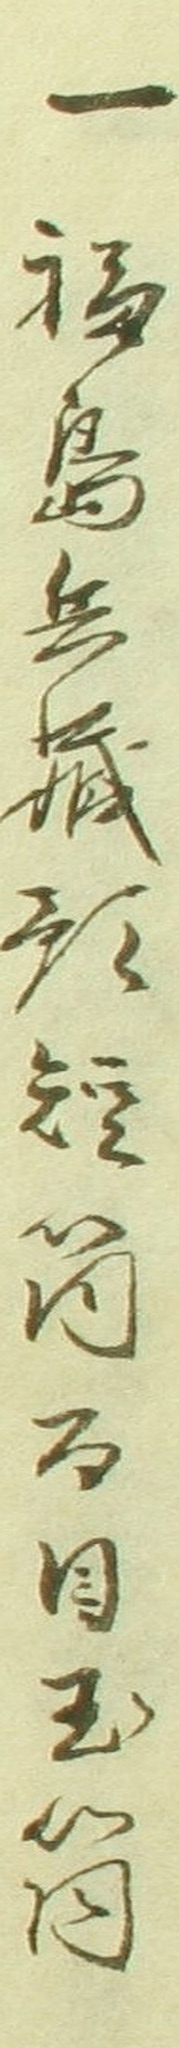一福島兵蔵預短筒百目玉筒
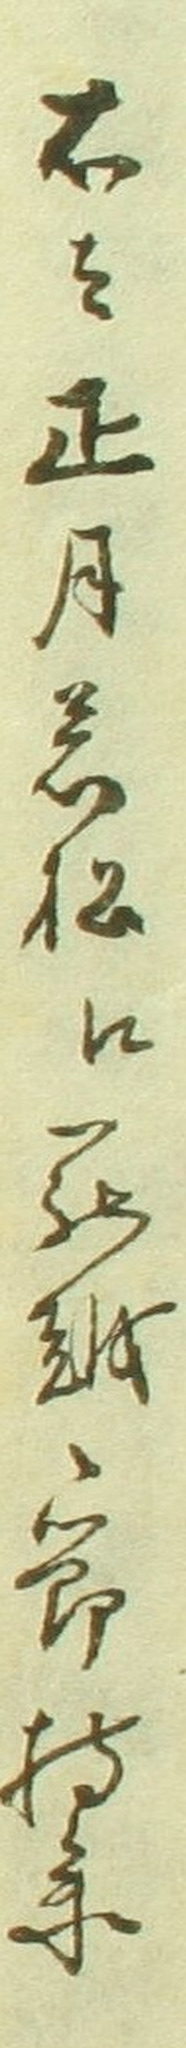右は正月若松江罷越候節持参
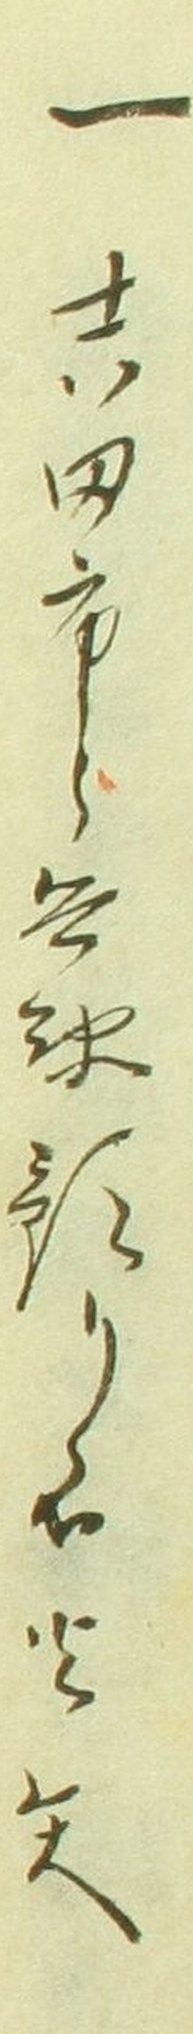一吉田市郎兵衛預り石火矢
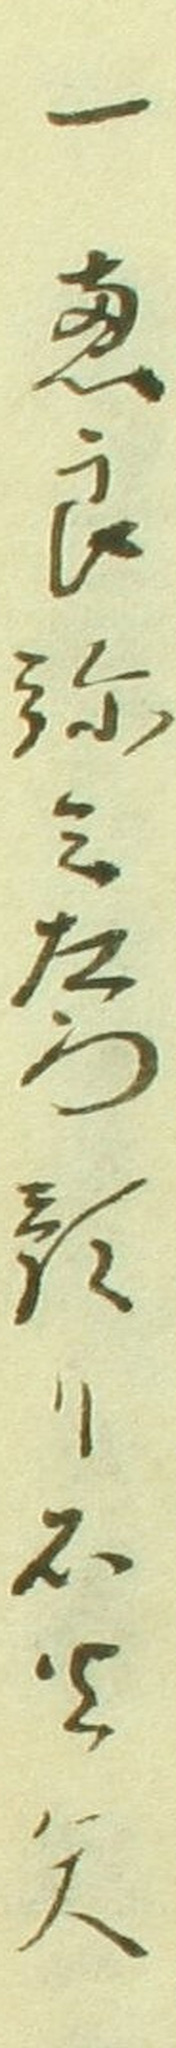一恵良弥之左衛門預り石火矢
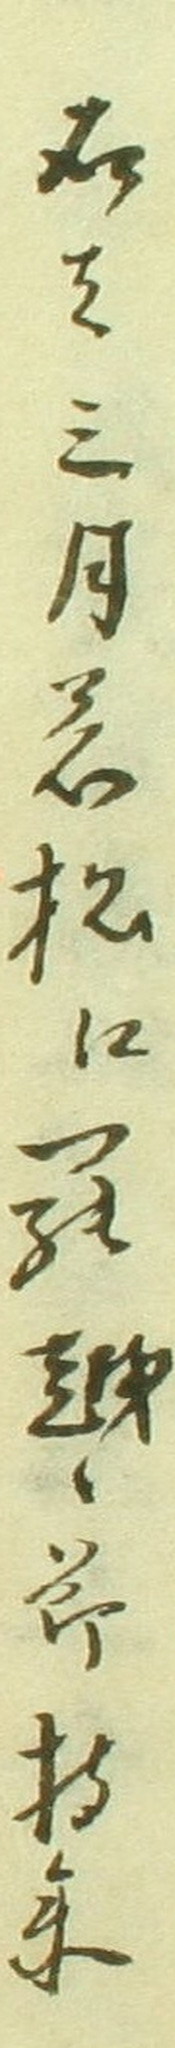右は三月若松江罷越候節持参
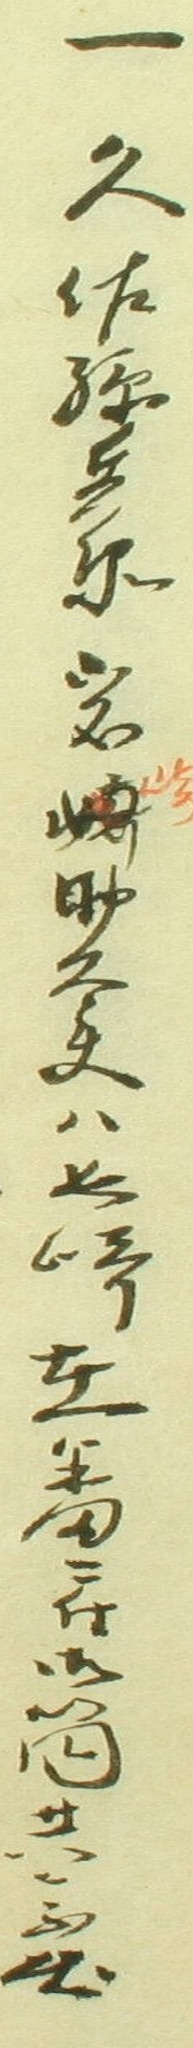一久佐孫兵衛岩崎助太夫は長崎在番ニ付御筒共被不出
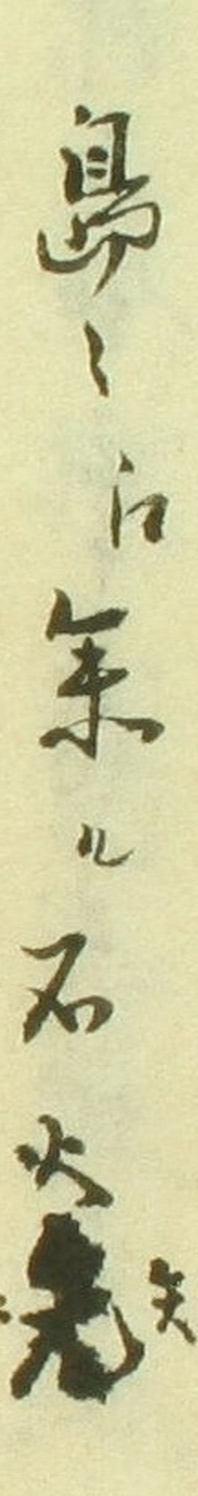島々江参ル石火矢
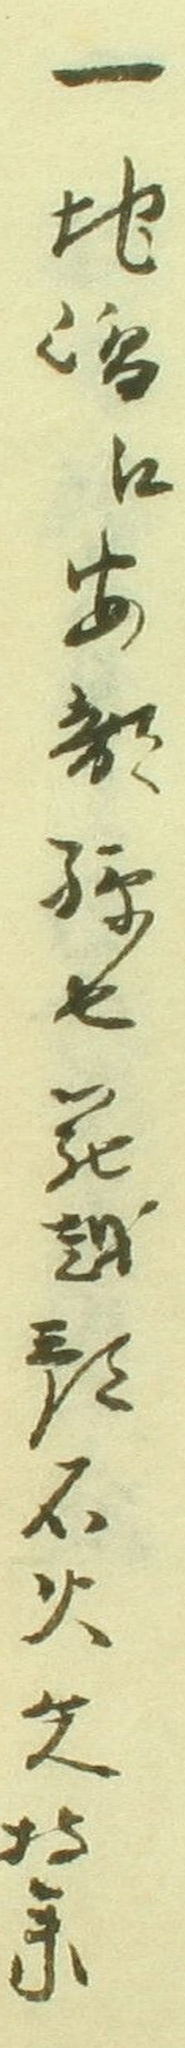一地嶋江安部孫七罷越預石火矢持参
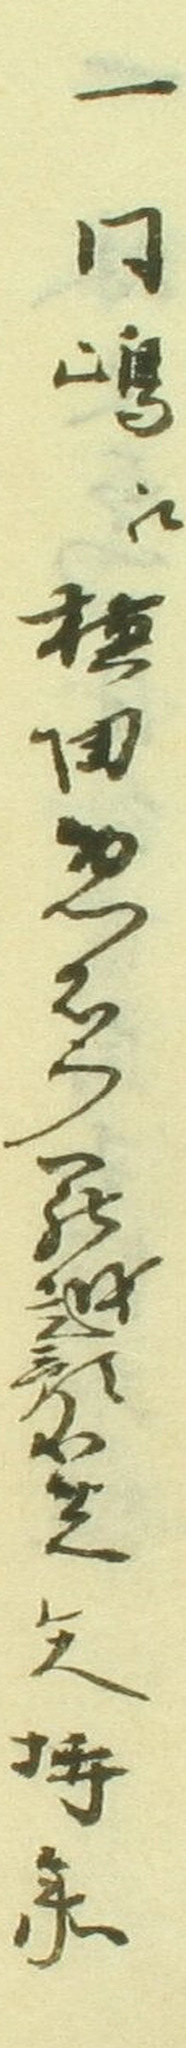一同嶋江横田惣右衛門罷越預石火矢持参
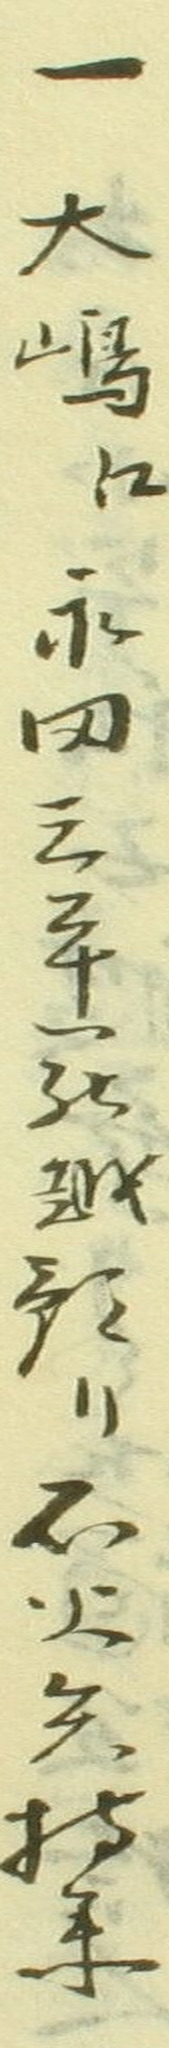一大嶋江永田三平罷越預り石火矢持参
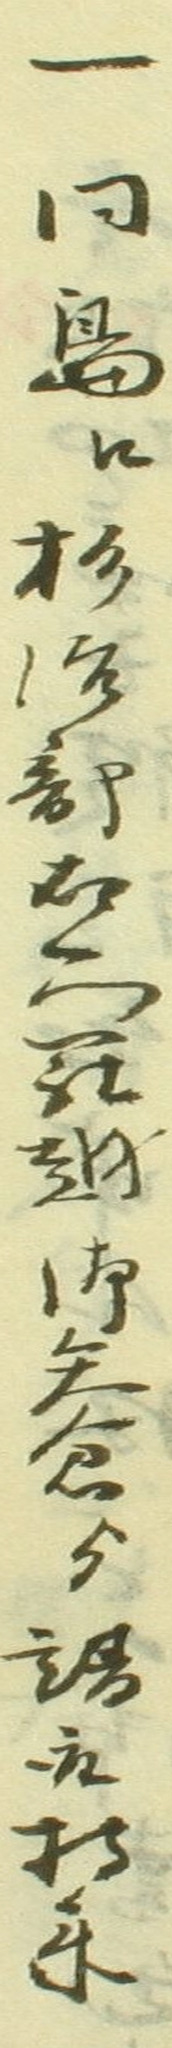一同島江杉治部右衛門罷越御矢倉ゟ請取持参
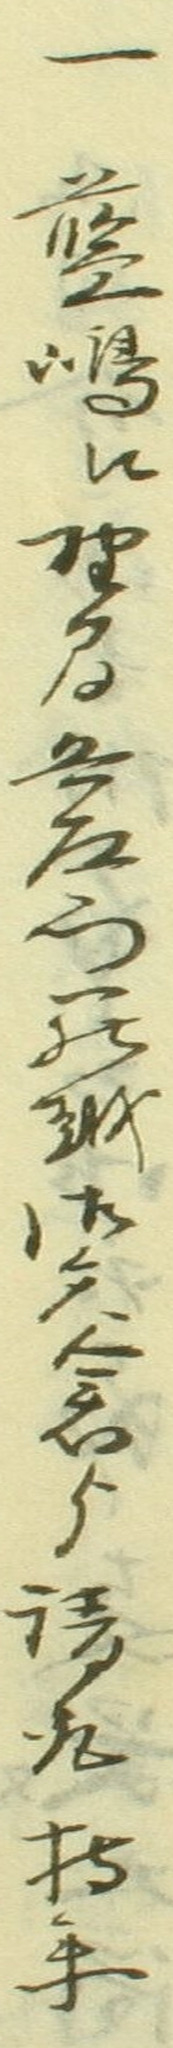一藍嶋江野間各左衛門罷越御矢倉ゟ請取持参
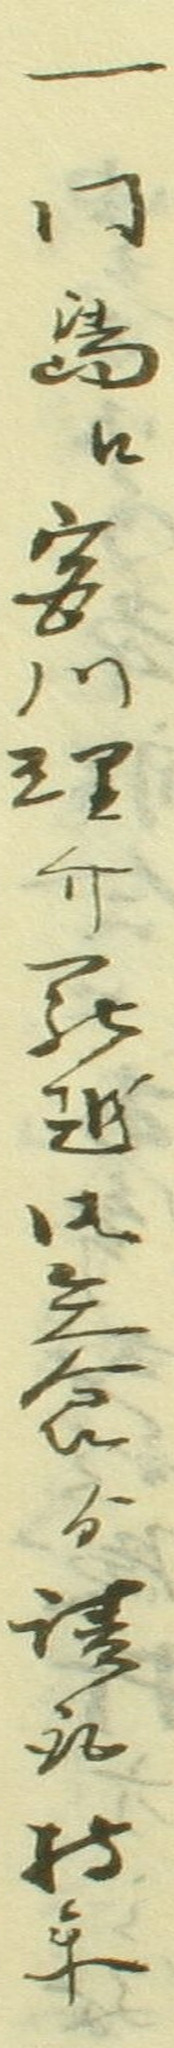一同島江宮川理介罷越御矢倉ゟ請取持参
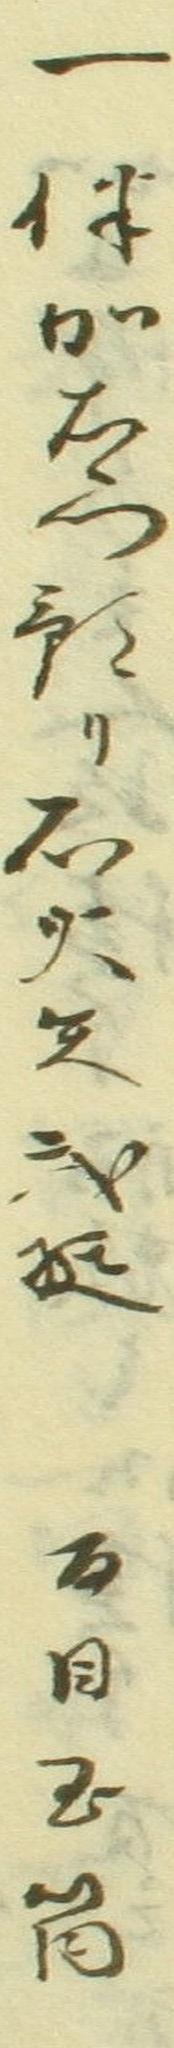一伴加右衛門預り石火矢弐挺百目玉筒
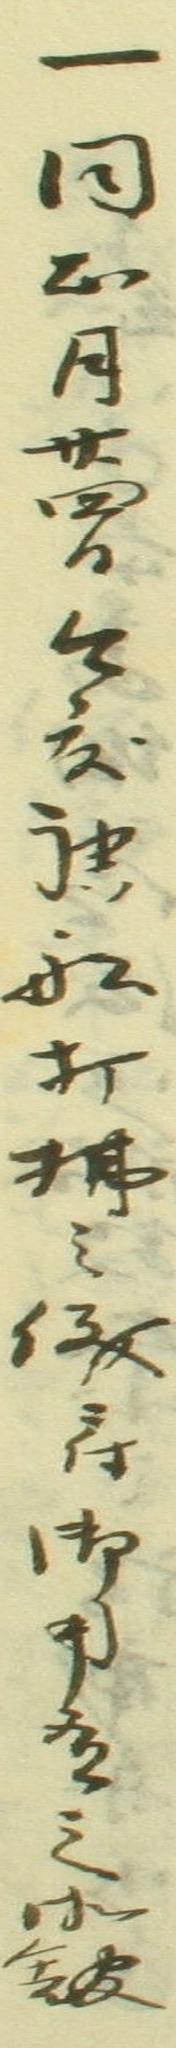一同正月廿四日今度唐船打払之儀ニ付御用有之御館
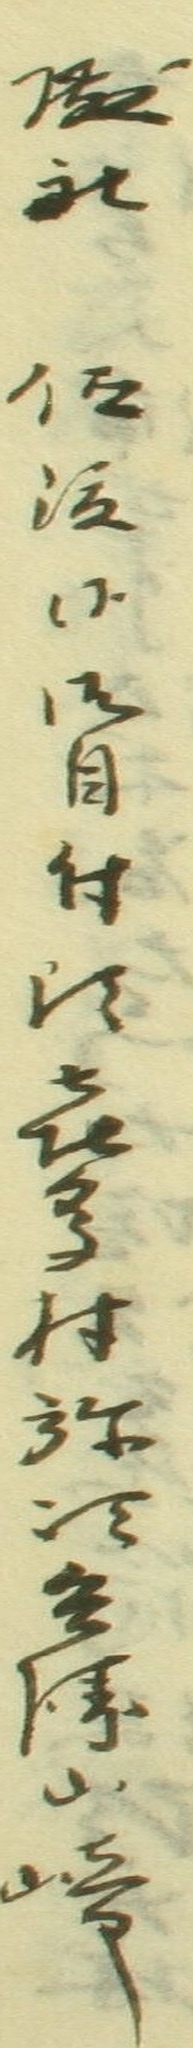殿被仰渡候御目付頭喜多村弥次兵衛山崎
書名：唐船漂流記 二
